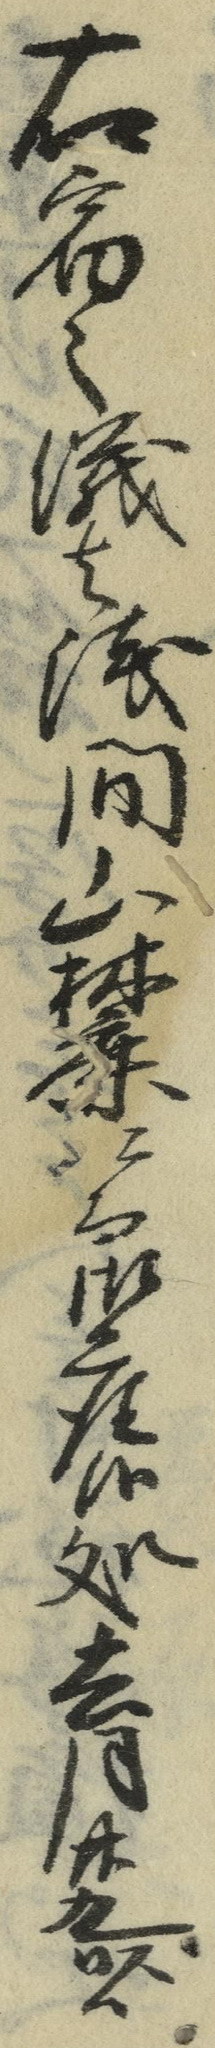右宿之儀者浅間山麓に而御座候処去月廿九日ゟ
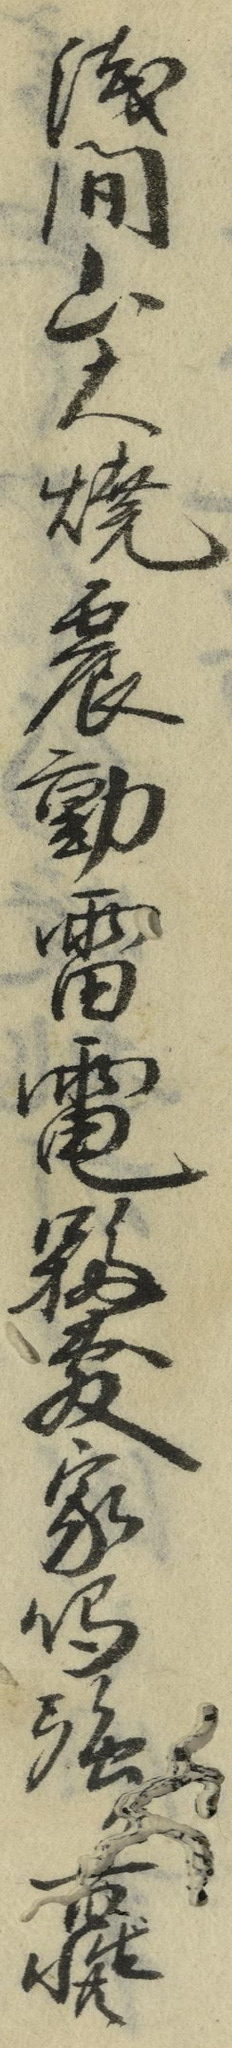浅間山大焼震動雷電夥敷家鳴強ク百姓共
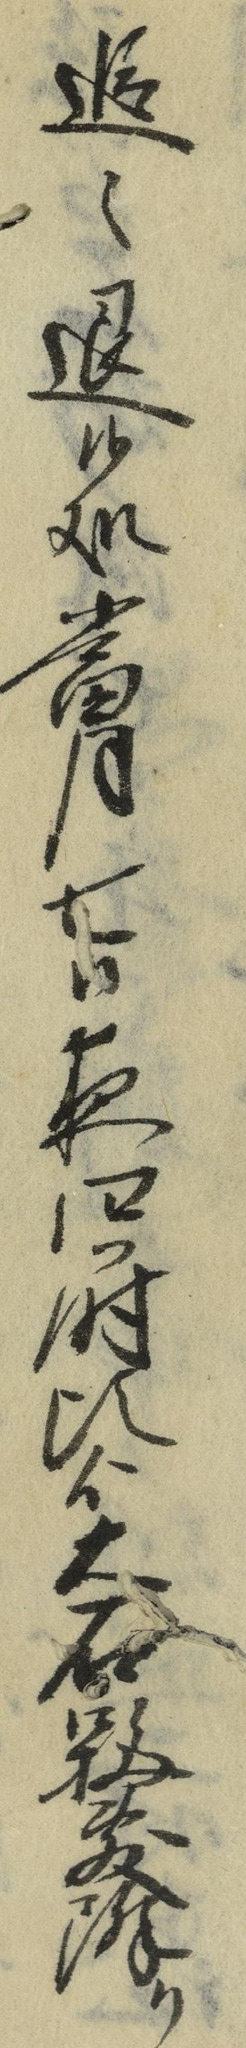追々退候処當月七日夜四つ時頃ゟ大石夥敷降リ
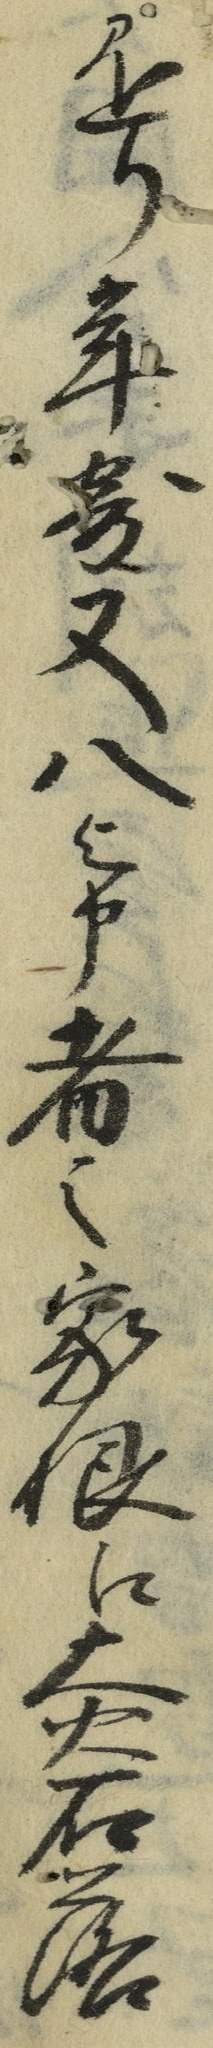懸り年寄又八と申者之家根江大火石落
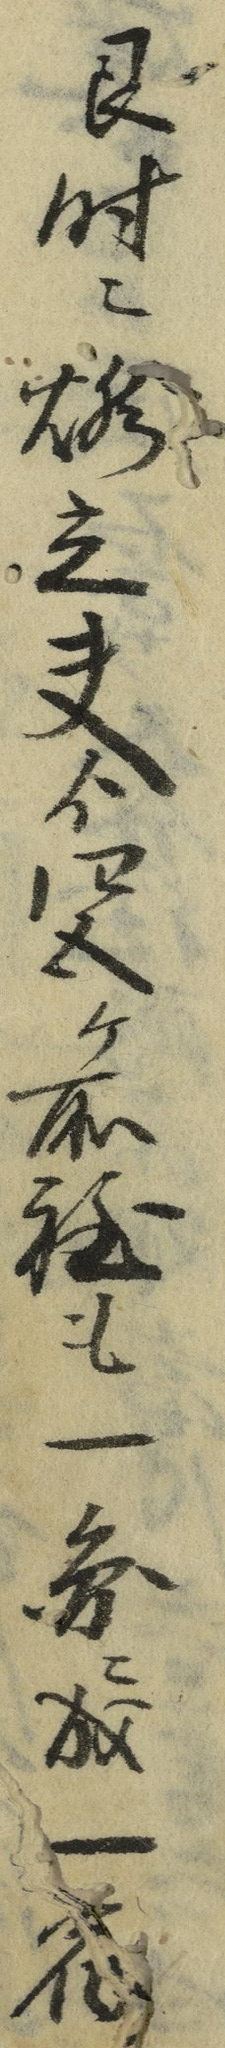艮時に燃立夫ゟ四五ヶ所程も一円に成一宿
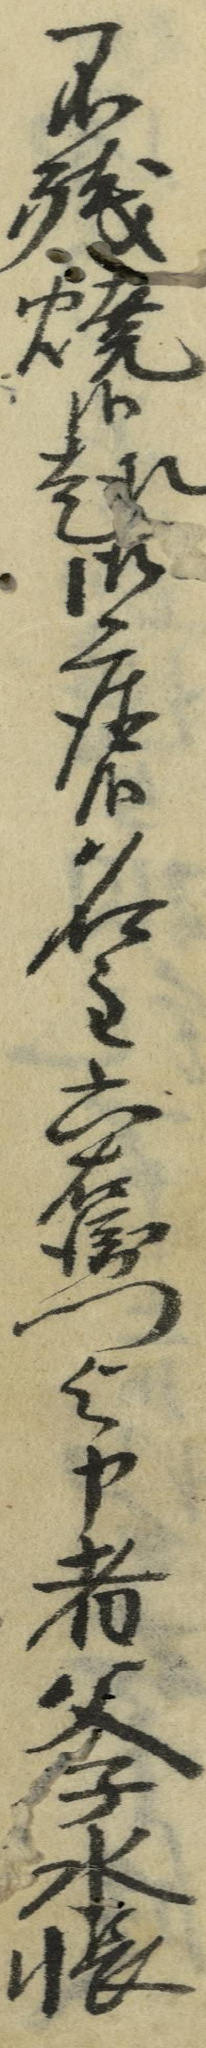不残焼候趣御座候名主六右衛門と申者父子水帳
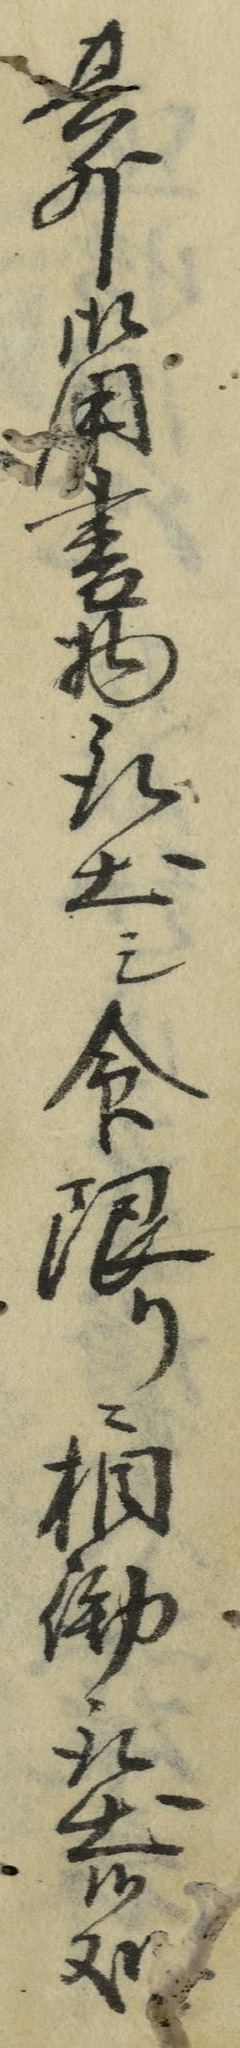其外御用書物取出シ命限りに相働取出候処
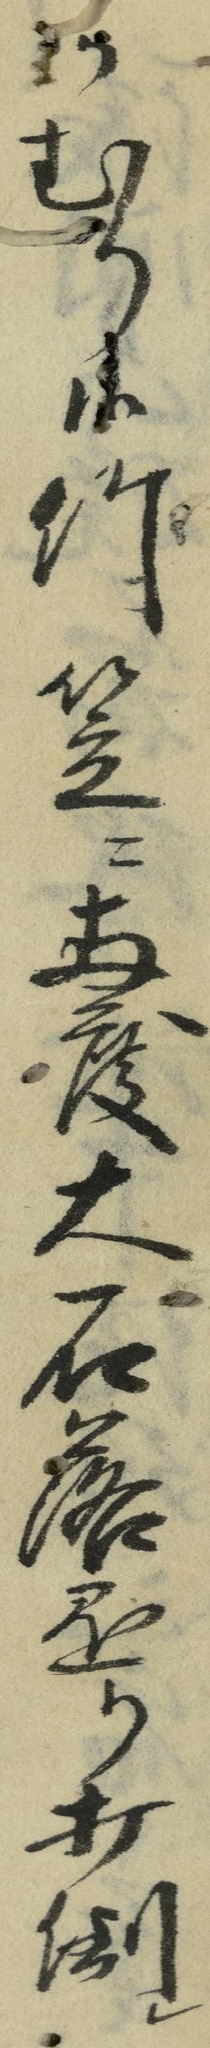かむり候竹笠に両度大石落懸り打倒シ
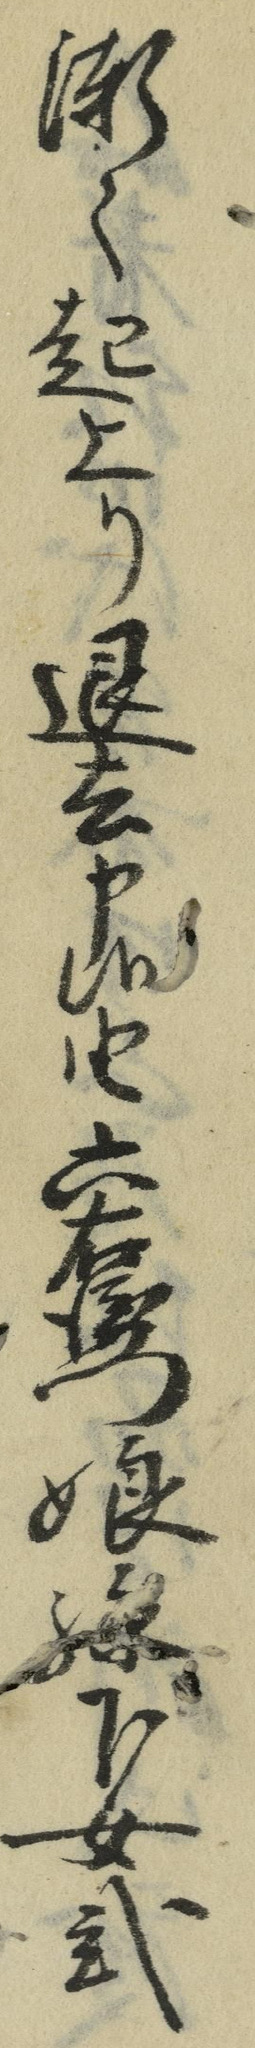漸く起上り退去申候由六右衛門娘孫下女弐
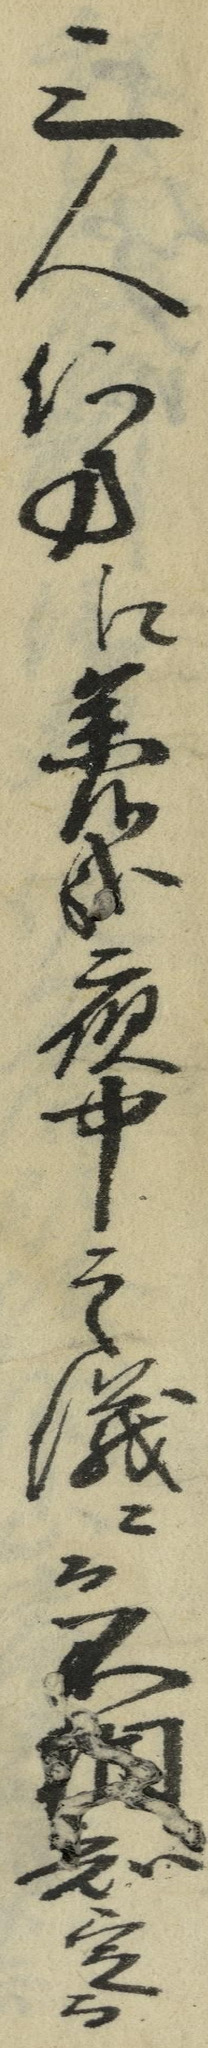三人何方江参候や夜中之儀に而不相知定而
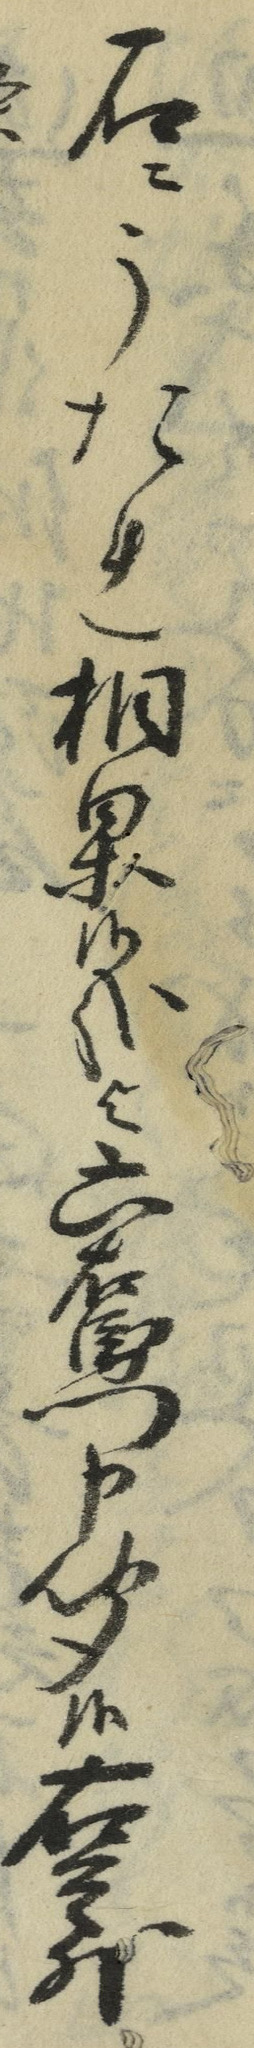石にうたれ相果候やと六右衛門申聞候右其外
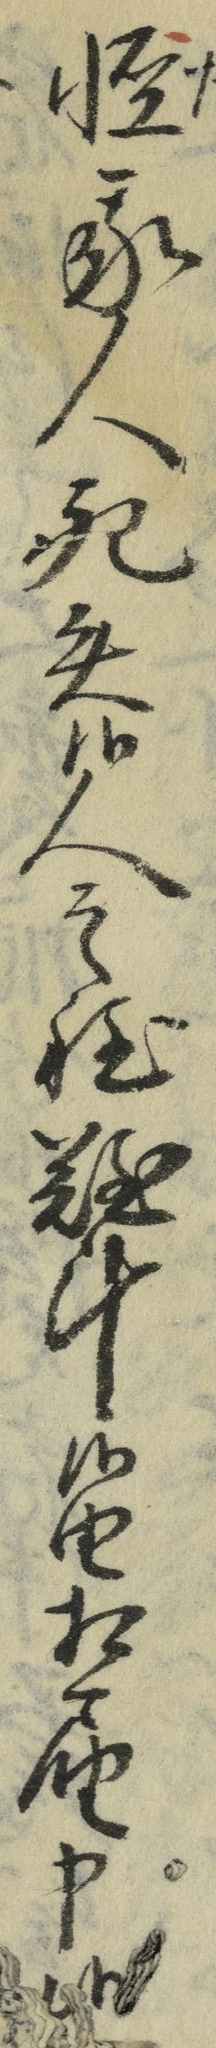怪我人死失候人之程難計候由相届申候
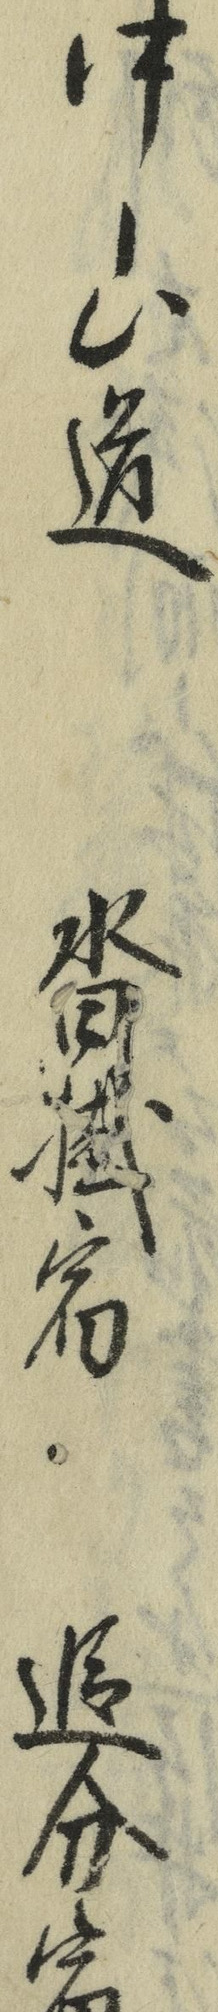中山道沓掛宿追分宿

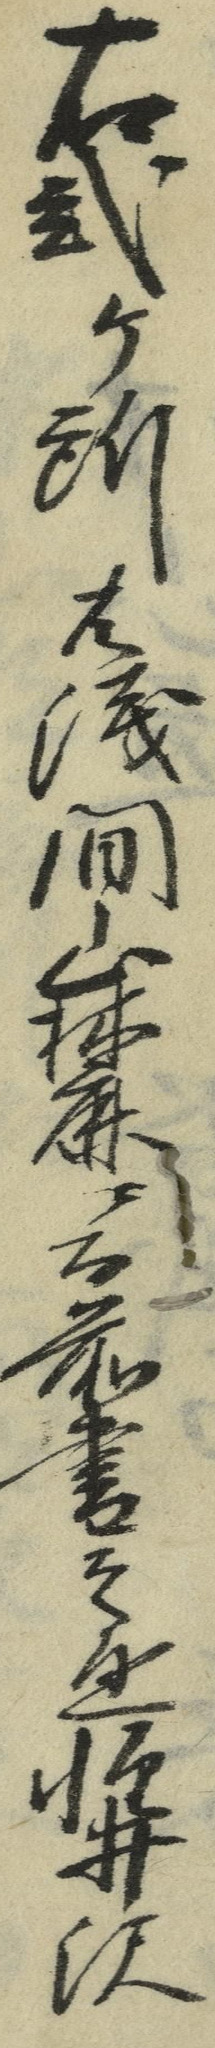右弐ケ所は浅間山麓に而前書之通軽井沢
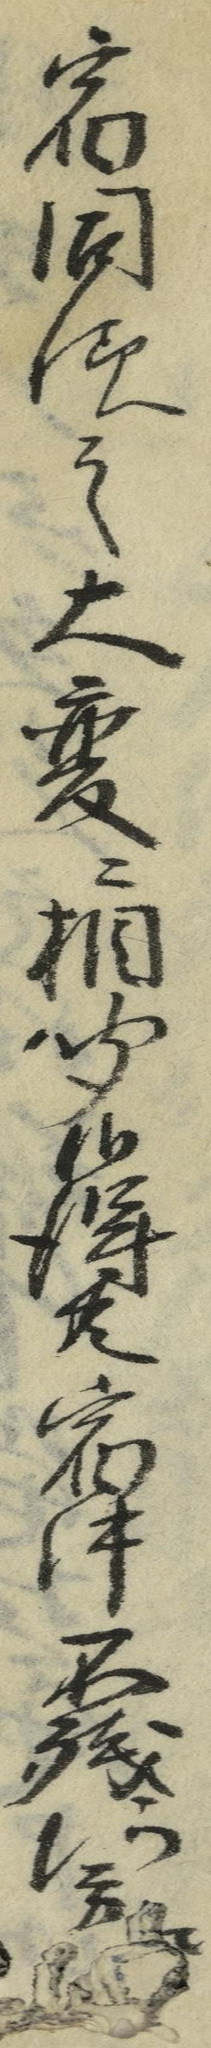宿同様之大変に相聞候得共宿中不残何方江
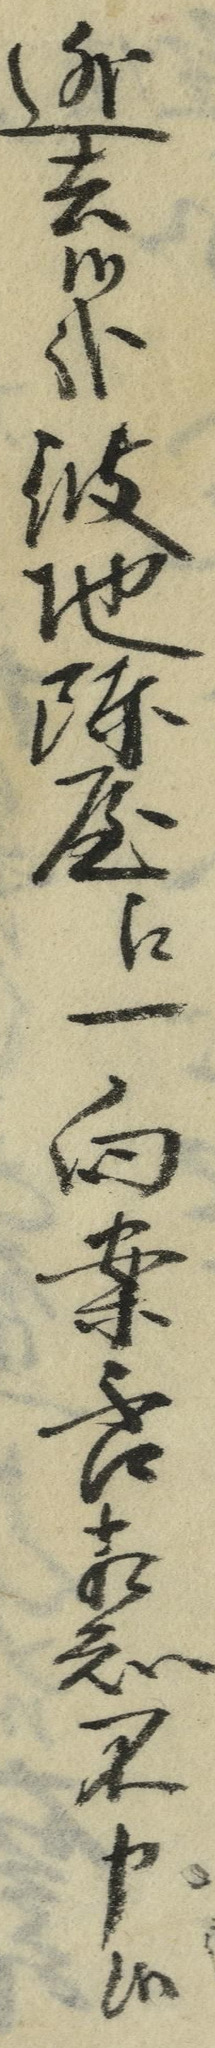迯去候哉彼地陣屋江一向案否相知不申候
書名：天明三卯年七月　浅間山焼注進写
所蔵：東京大学地震研究所図書室 Earthquake Research Institute Library, The University of Tokyo, JAPAN
